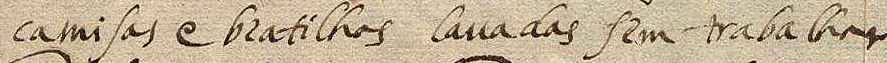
camisas e bratilhas lauadas sem trabalhar
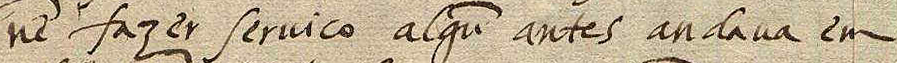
ne̅ fazer seruico algu̅ antes andaua em
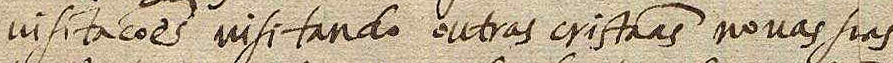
uisitações uisitando outras cristaãs nouas suas
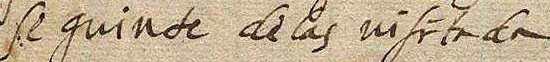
seguinte delas uisitada
